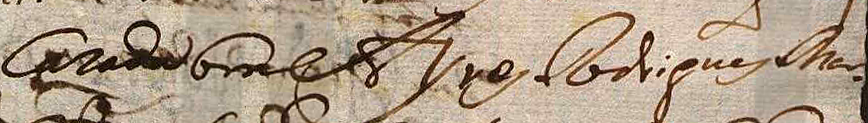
Cazada Com Ayres Rodrigues Mer
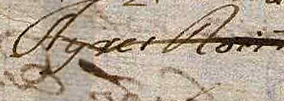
Ayres Rois̄
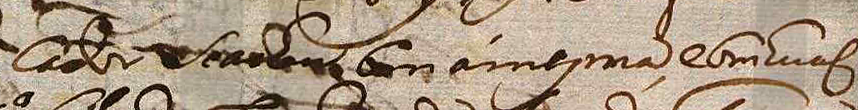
cador se achou com a mesma, e com huã
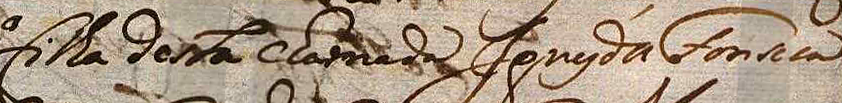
filha desta chamada Jgnes da Fonseca
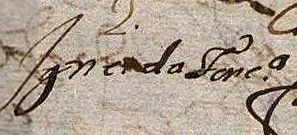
Jgnes da Fonc.a
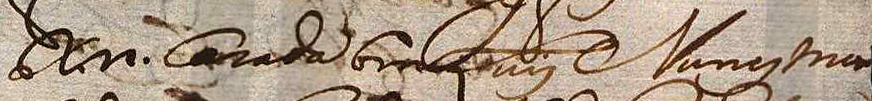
x.n. Cazada Com Luis Nunes mer
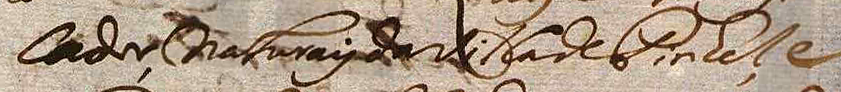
Cador, naturais da Villa de Pinhel, e
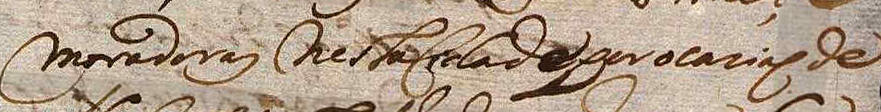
moradoras nesta Cidade por ocaziaõ de
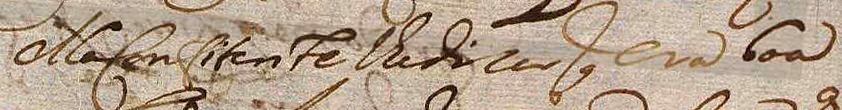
ella Confitente lhe dizer q̄ era boa
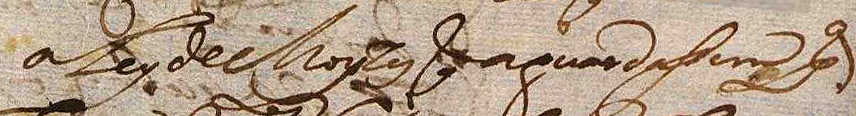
a Ley de Moyses q̄ a guardassem pa
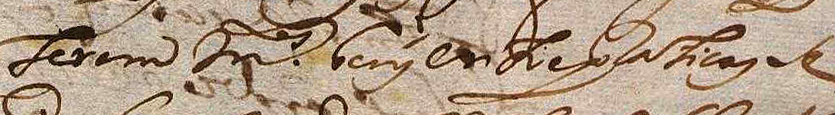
terem m.tos bens̄ entre pRaticas se
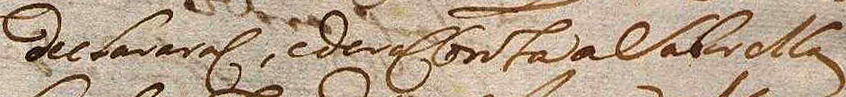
declararaõ, e deraõ Conta a Saber ella
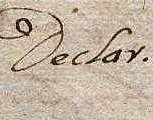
Declar.
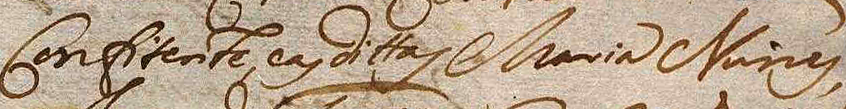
Confitente, e as dittas Maria Nunes,
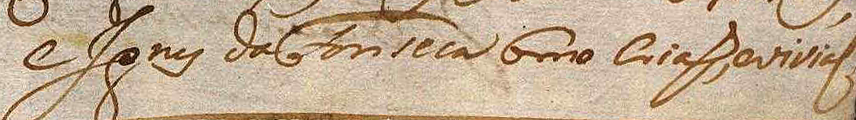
e Jgnes da Fonseca Como Criaõ, e viviaõ
